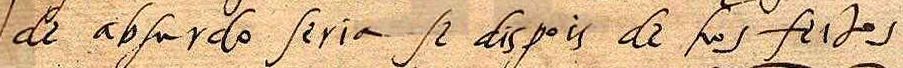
de absurdo seria se dispois de hos feitos
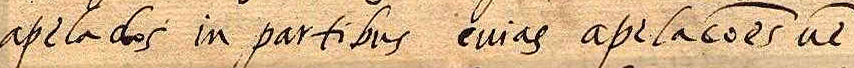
apelados in partibus cuias apelaçoẽs uē
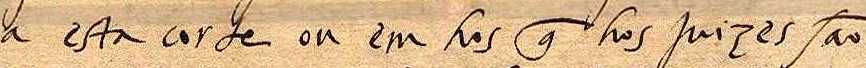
a esta corte ou em hos q̄ hos Juizes são
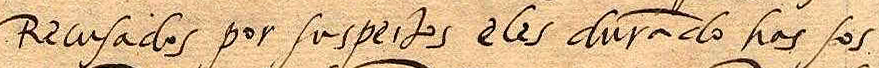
Recusados por suspeitos eles durādo has sos
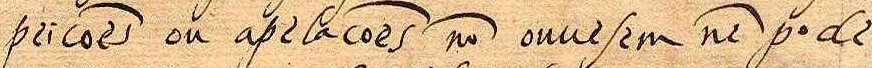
peições ou apelações nō ouuesem nē pode
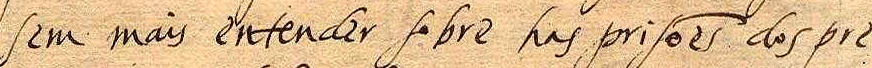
sem mais entender sobre has prisões dos pre
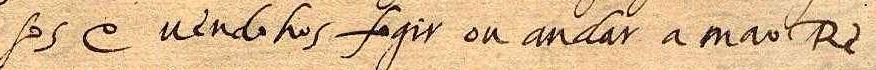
tos e uendo hos fogir ou andar a mao Re
